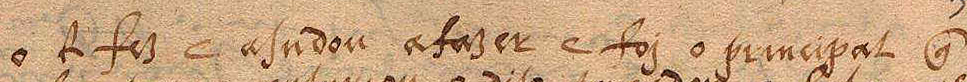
o R fez e aJudou a fazer e foj o principal q̄
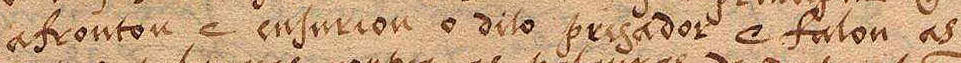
afrontou e enJuriou o dito pregador e falou as
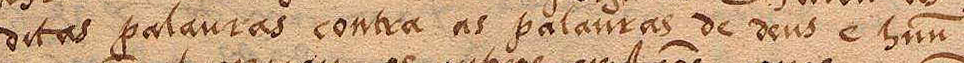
ditas palauras contra as palauras de deus e hu̅u
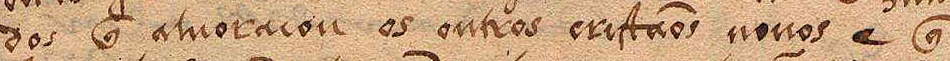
dos q̄ aluoracou os outros cristãos nouos e q̄
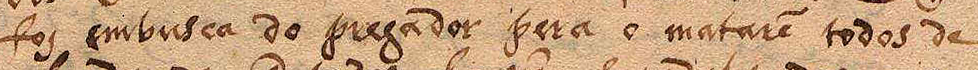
foj em busca do pregador pera o matarē todos de
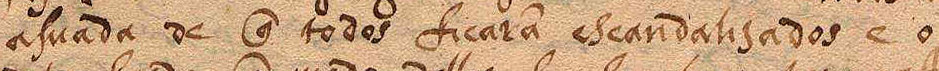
asuada de q̄ todos ficarā escandalizados e o
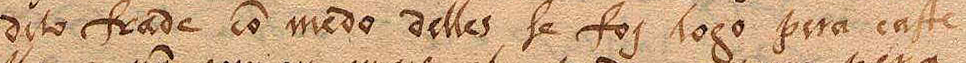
dito frade cō medo delles se foj logo pera caste
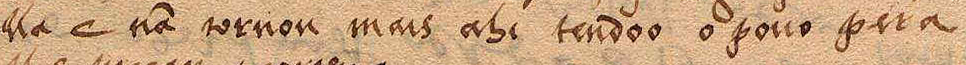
lla e nā tornou mais ahi tendoo o pouo pera
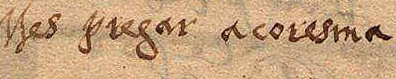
lhes pregar a coresma
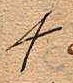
4
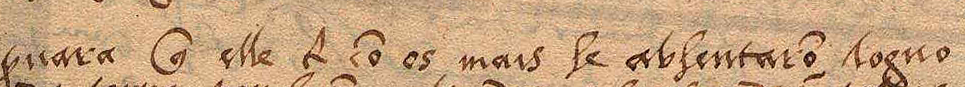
ꝓuara q̄ elle R cō os mais se absentarō loguo
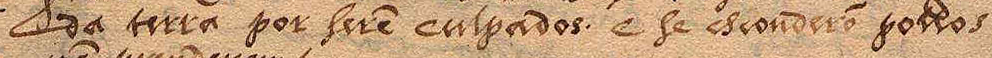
da terra por serē culpados. e se esconderō pollos
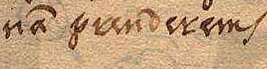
nā prenderem /
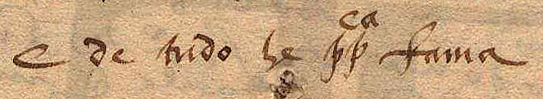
e de tudo he ppca fama
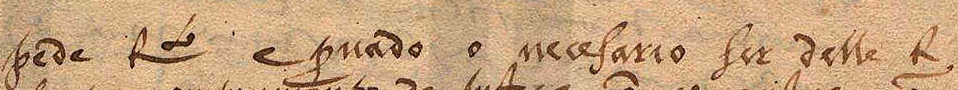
pede Rto e ꝓuado o necesario ser delle R
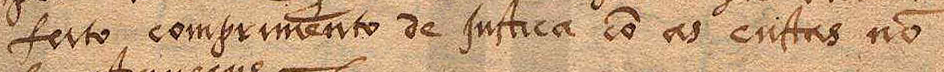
feito comprimento de Justica c̄o as custas nō
